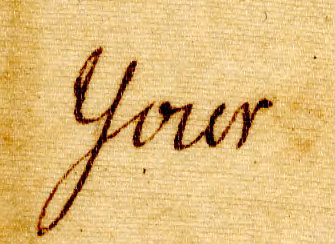Your
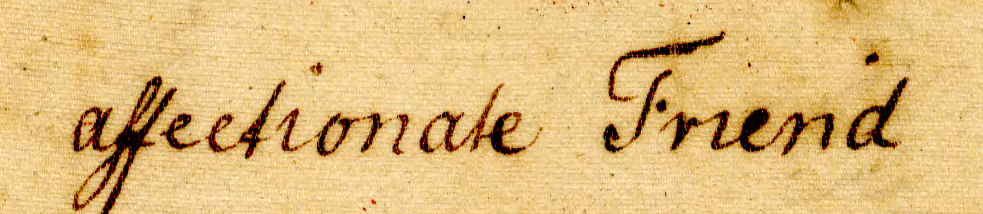affectionate Friend
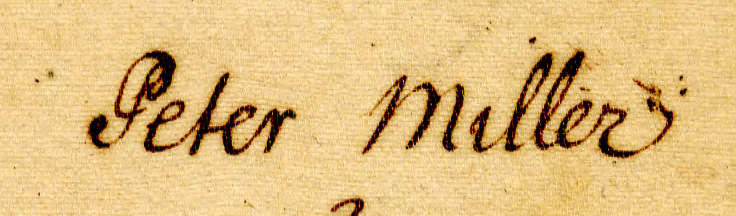Peter Miller
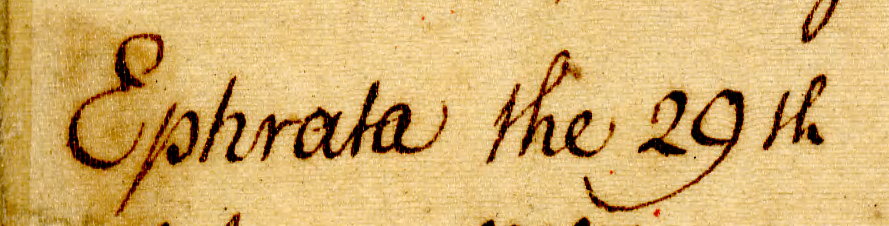Ephrata the 29th
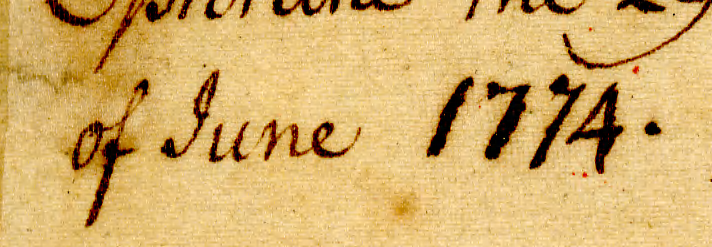Of June 1774.
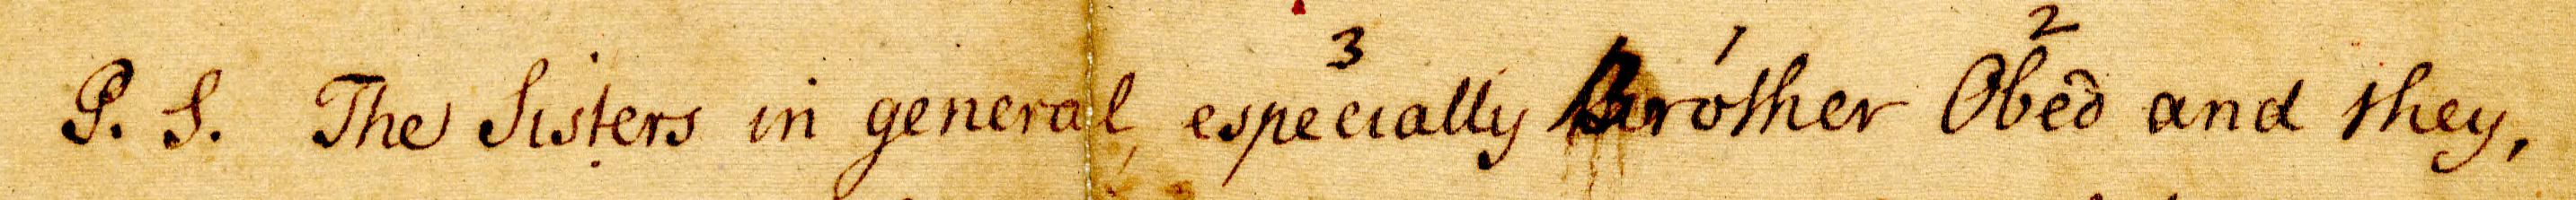P.S. The Sisters in general, especially Brother Obed and they,,
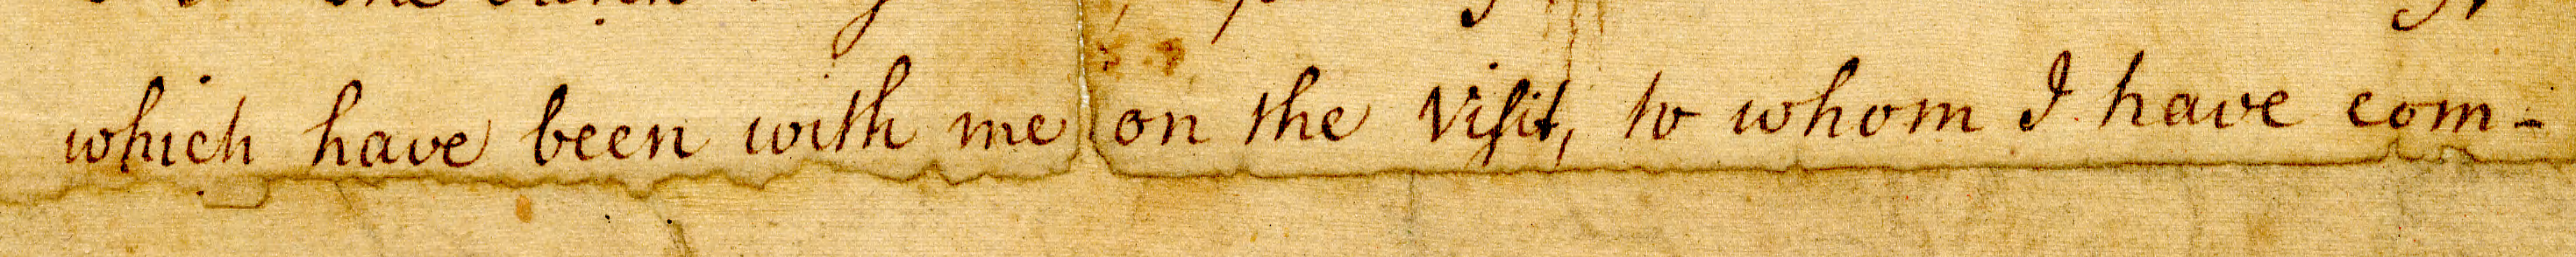which have been with me on the Visit, to whom I have com-
